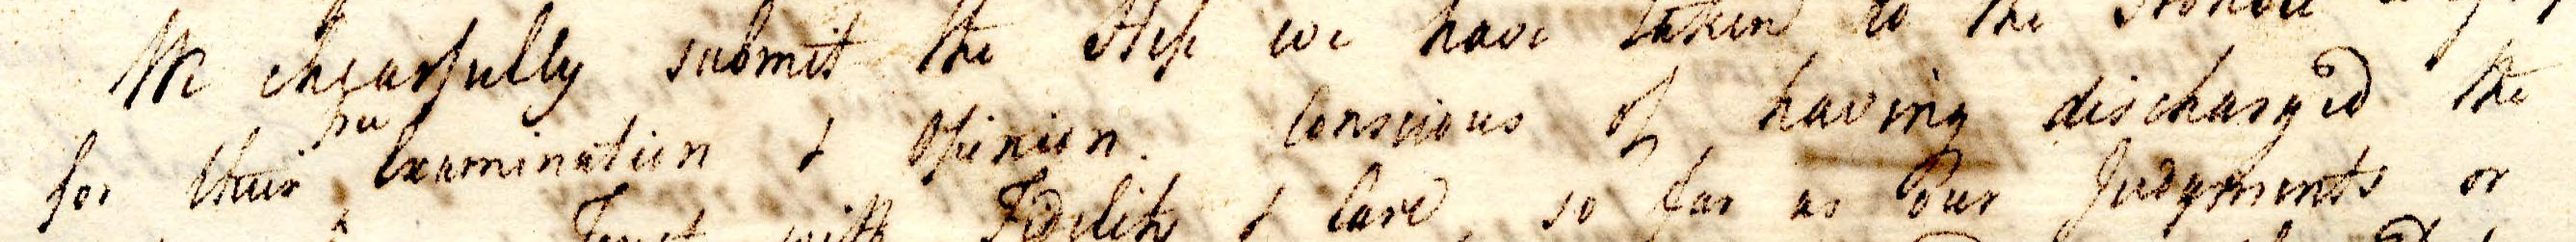for their ^ Examination & Opinion Conscious of having discharged the
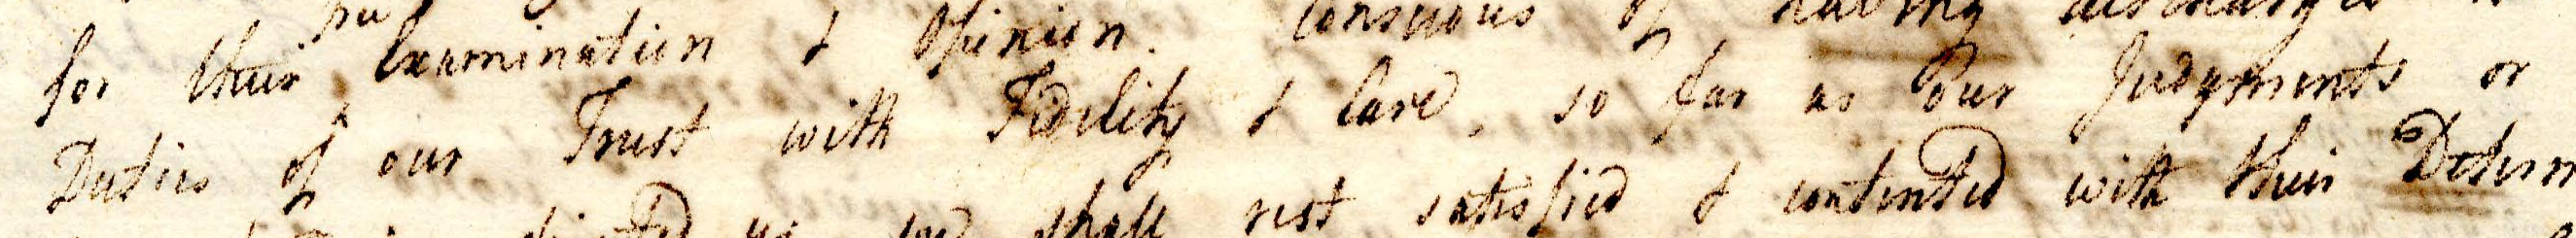Duties of our Trust with Fidelity & Care so for as our Judgments or
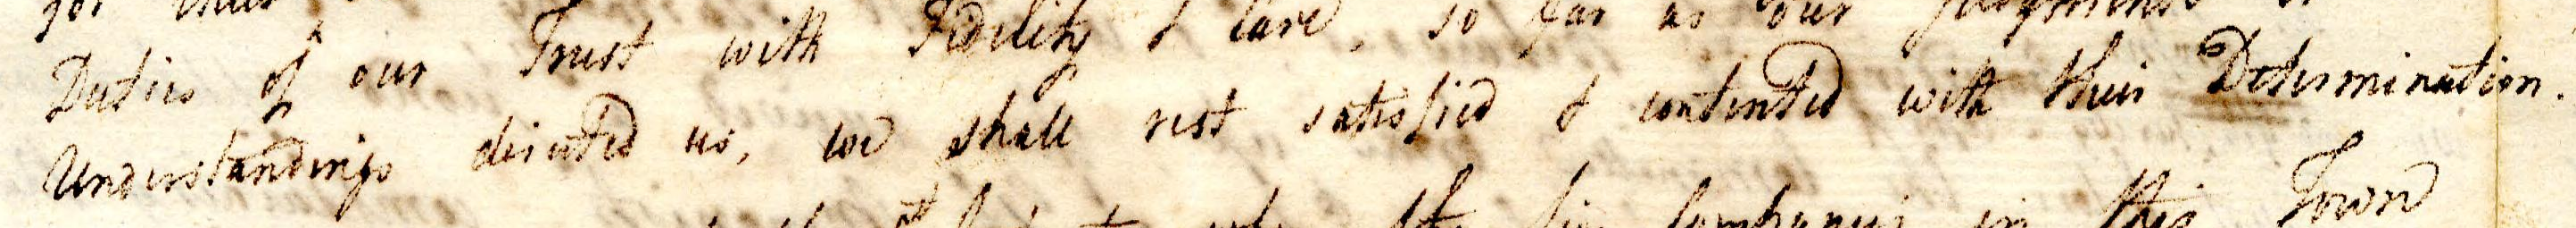Understandings directed us, we shall rest satisfied & contented with their Determination
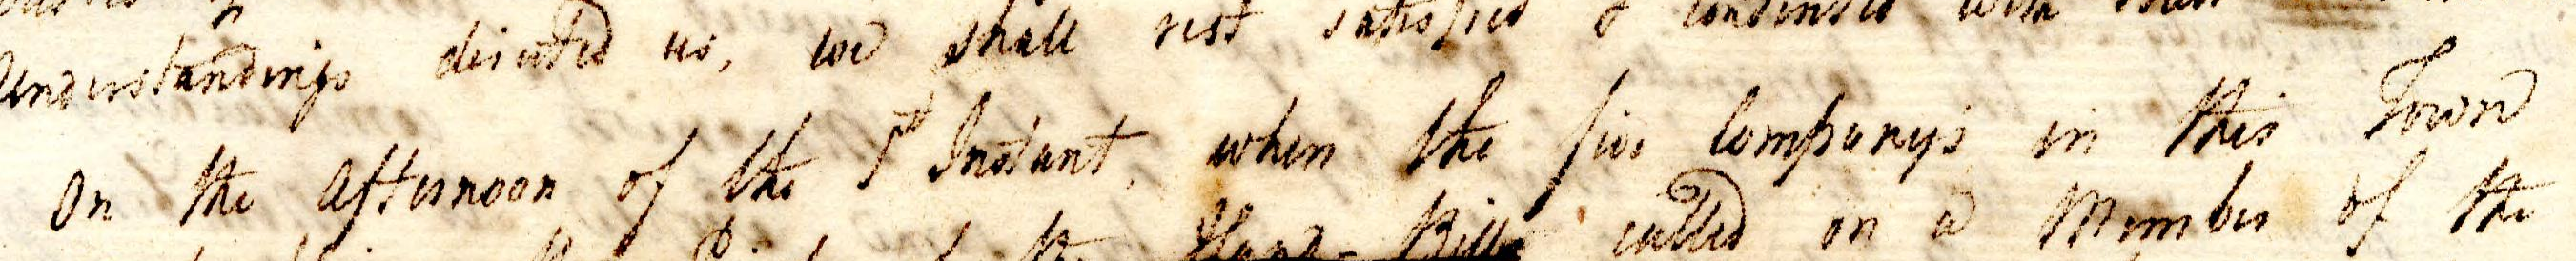On the afternoon of the 1^st Instant when the five Companys in this Town
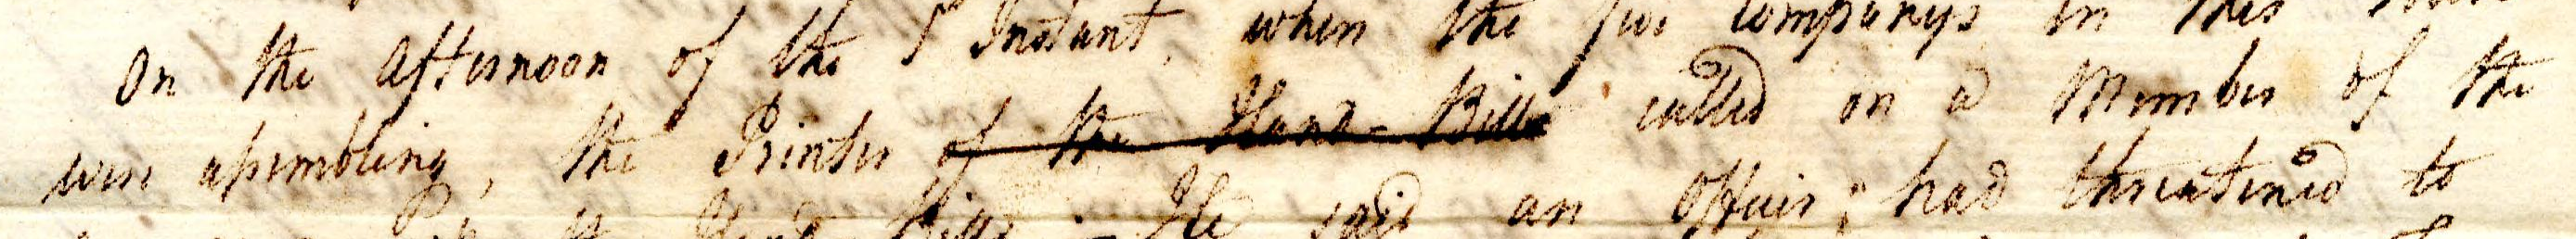were assembling, the Printer [of the Hand-Bills] called on a Member of the
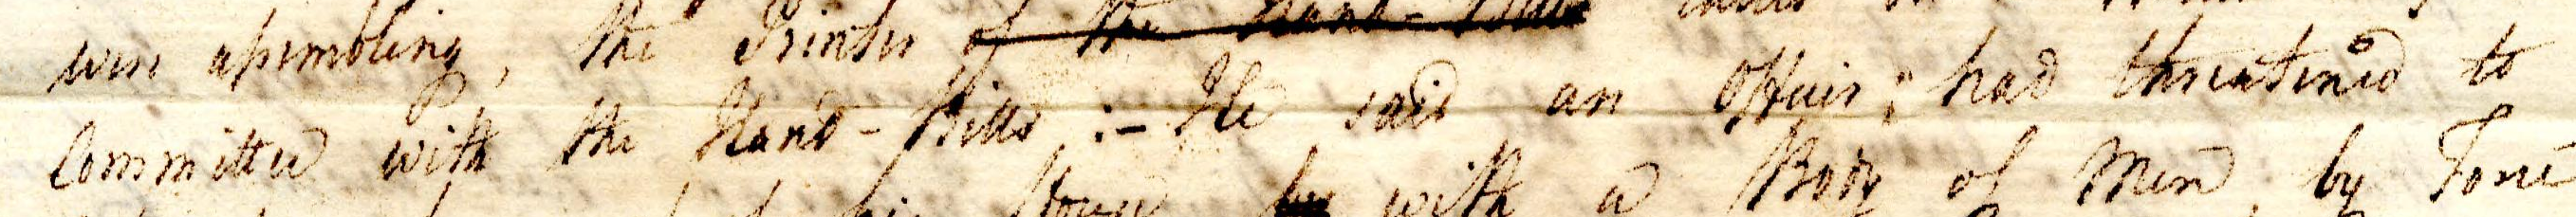Committee with the Hand- Bills: He said an Officer had threatened to
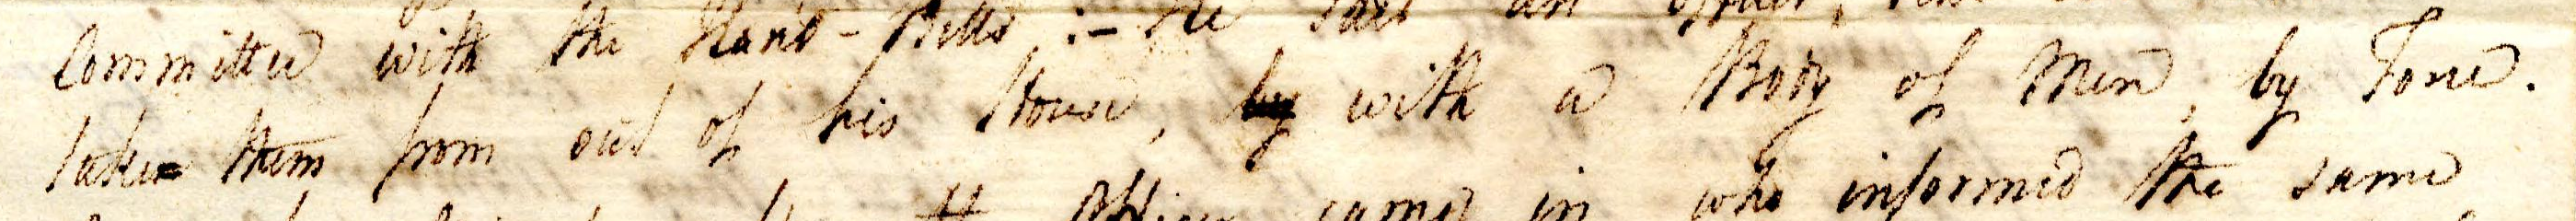take them from out of his House, by with a Body of Men; by Force.
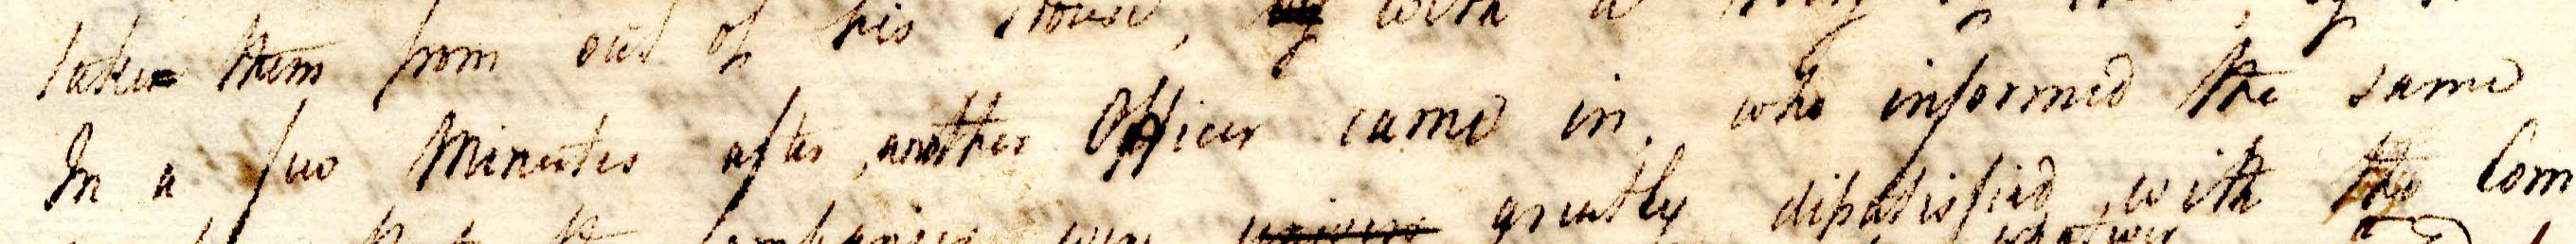In a few minutes after another Officer came in, who informed the same
